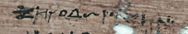ζηνοδωρο ν
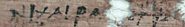νιχαιρ
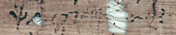ψαϲπ ν
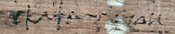ϲκαφεωνευδη
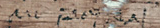μ ιδουναι
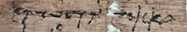εγωουντοιϲκα
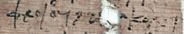φεοιουπ ακολ
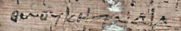θωουκειταιδια
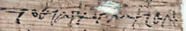τοευαρχονμηεν
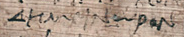δημεινωρον
